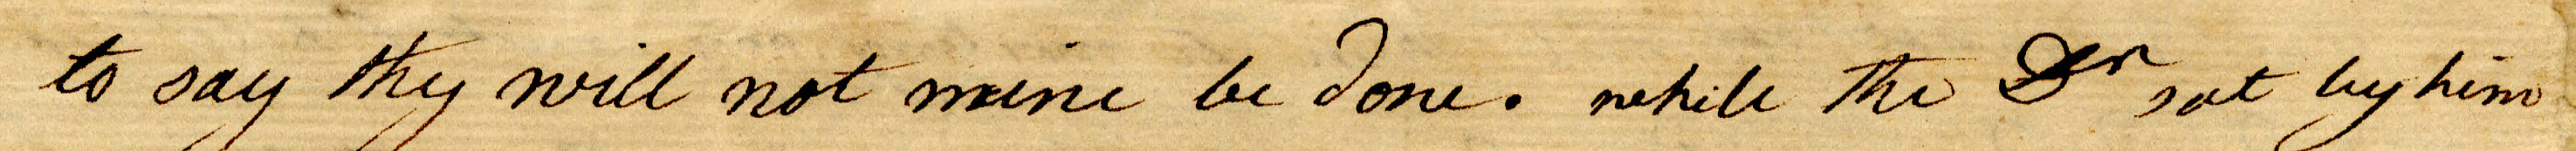to say thy will not mine be done. while the D^r sat by him
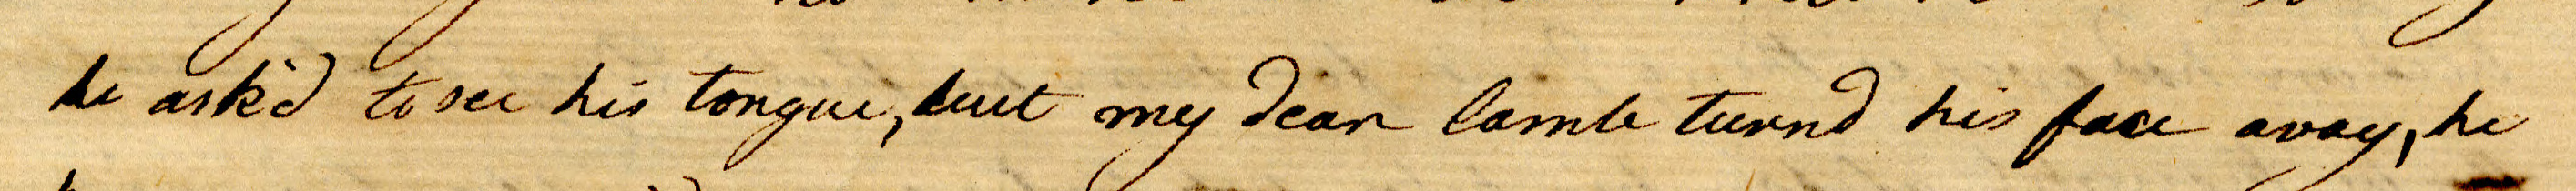he ask'd to see his tongue, but my dear lamb turnd his face away, he
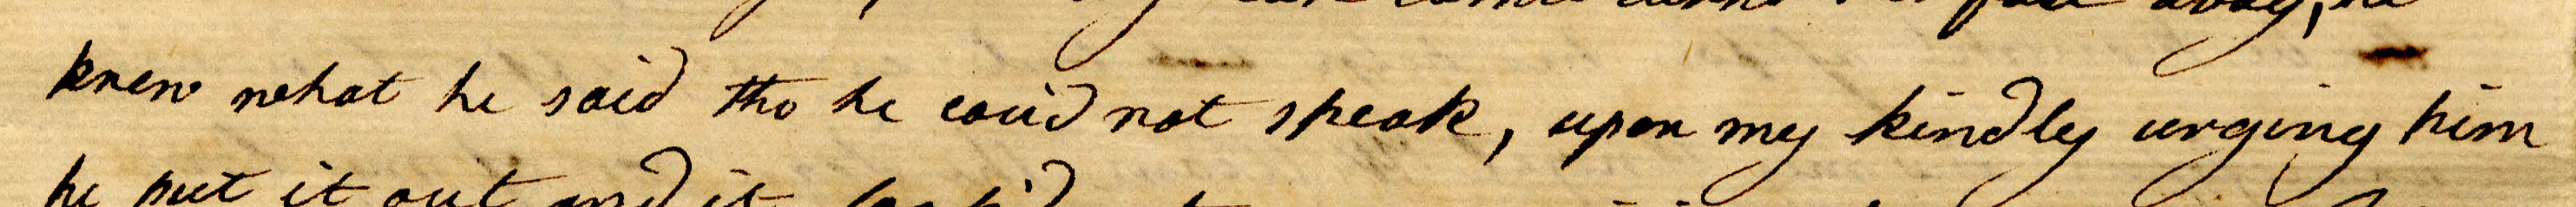knew what he said tho he cou'd not speak, upon my kindly urging him
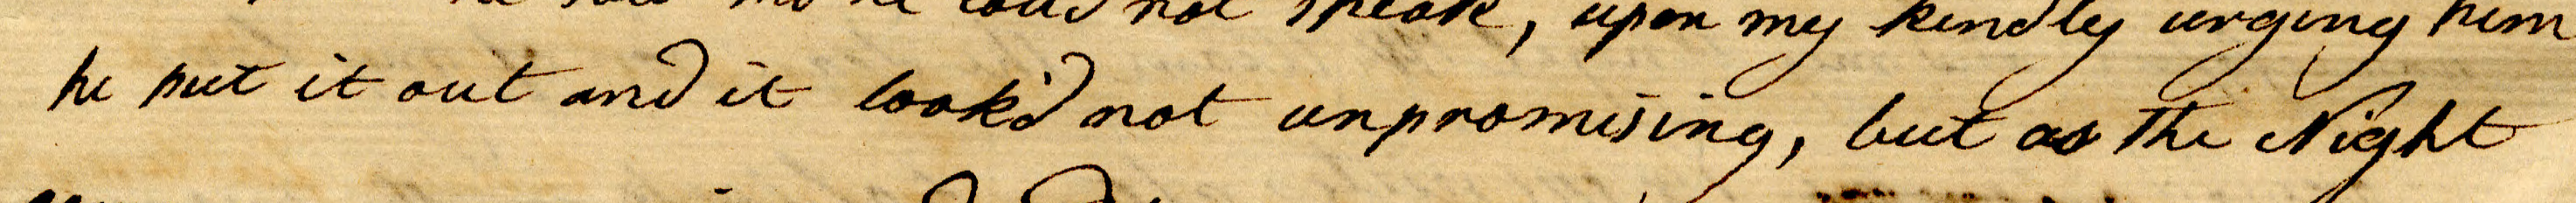he put it out and it look'd not unpromising, but as the Night
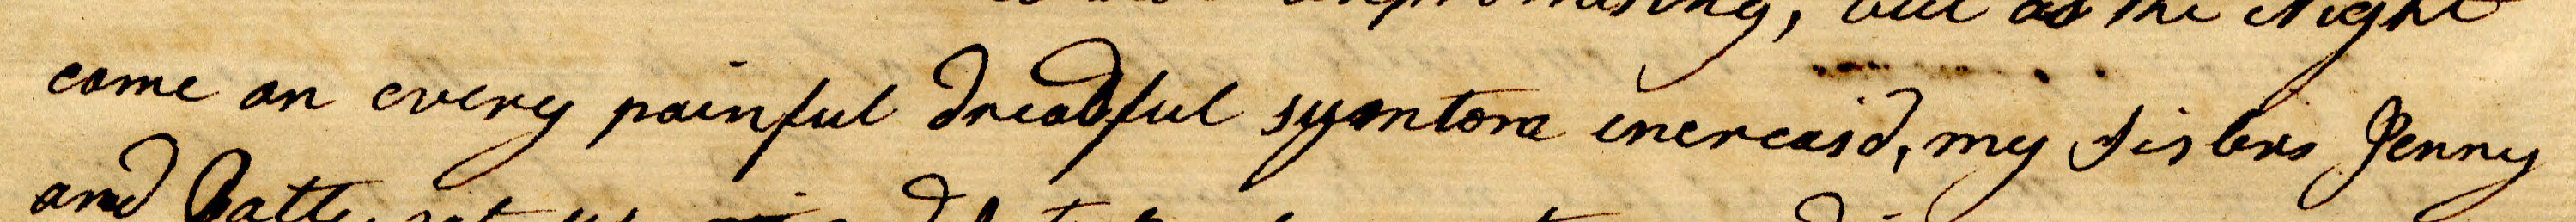came on every painful dreadful symtom increas'd, my sisters Jenny
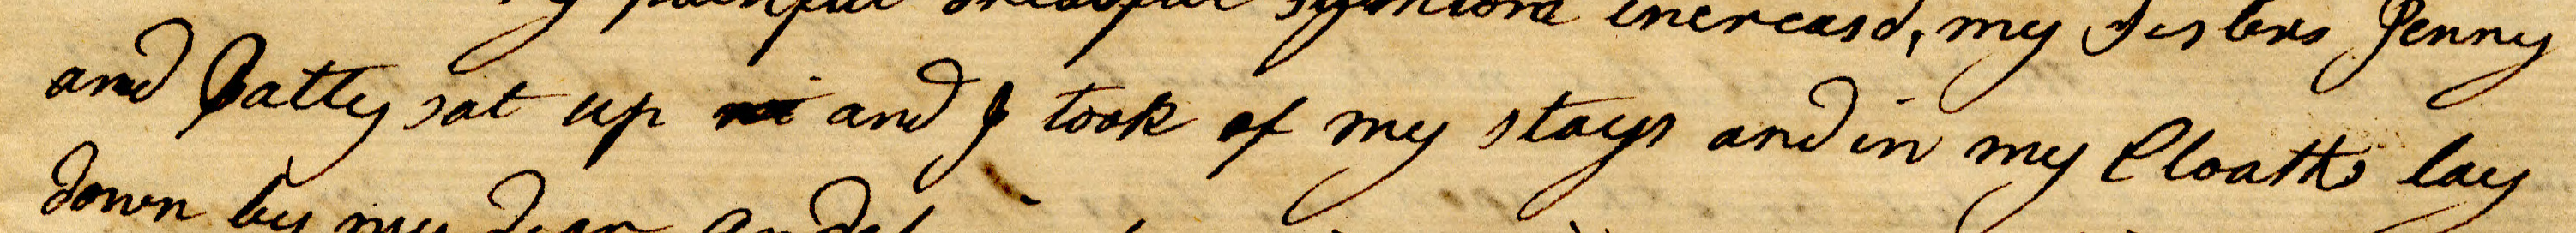and Patty sat up [__] and I took of my stays and in my Cloaths lay
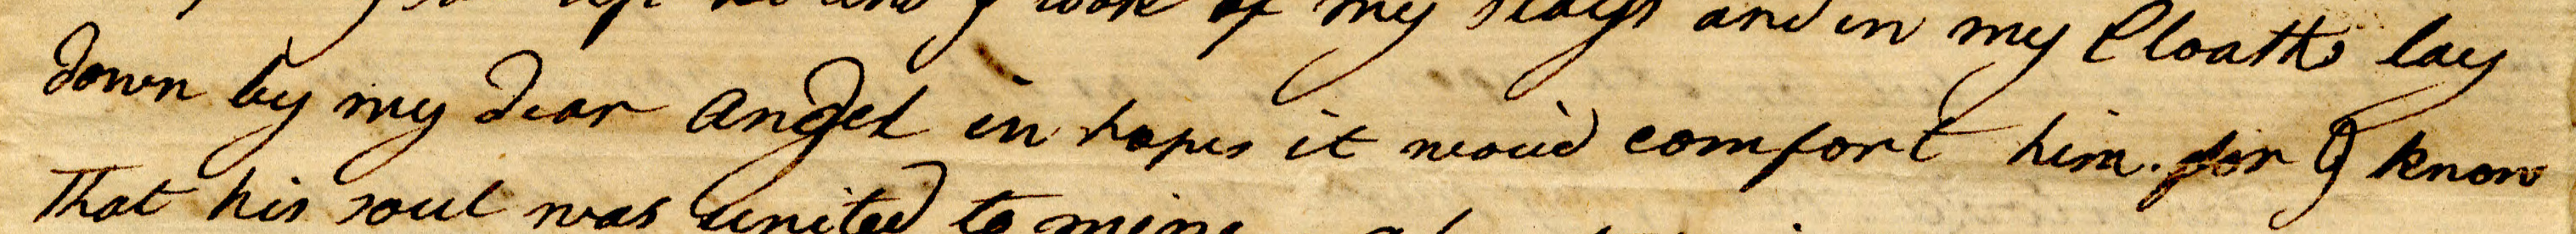down by my dear angel in hopes it wou'd comfort him for I know
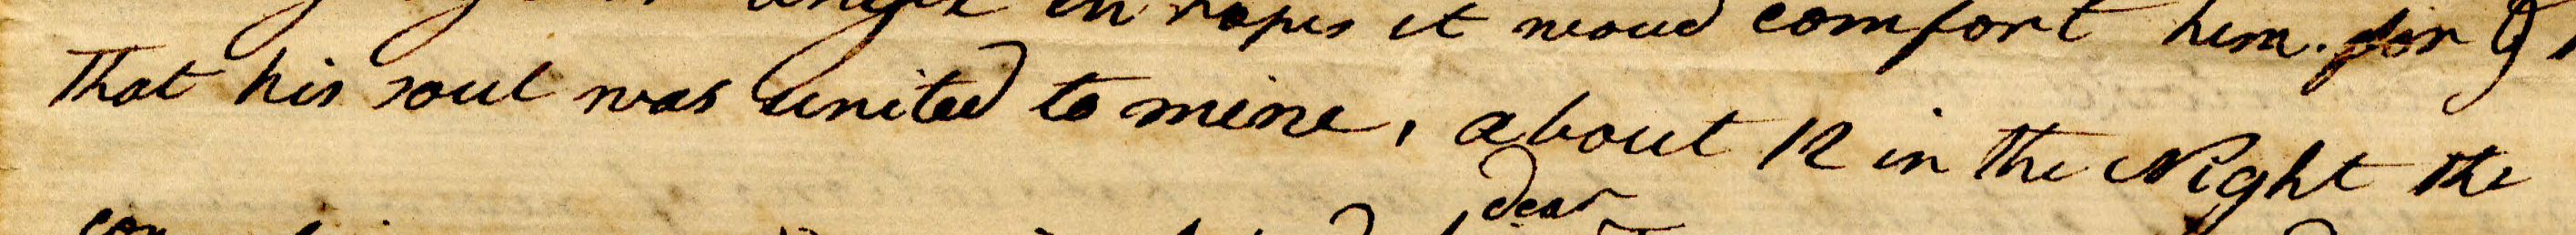that his soul was united to mine, about 12 in the Night the
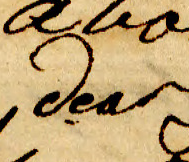dear
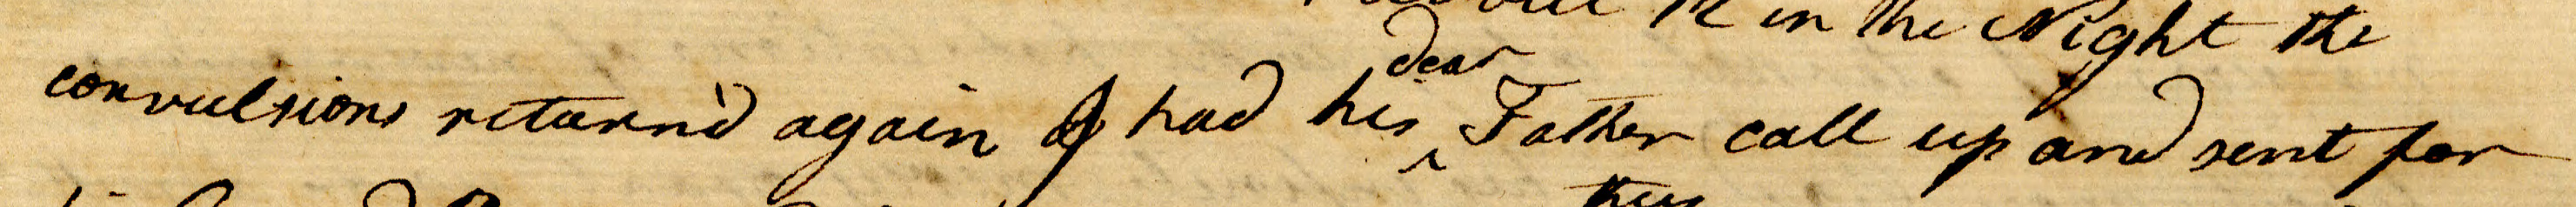convulsions return'd again I had his ^ Father call up and sent for
